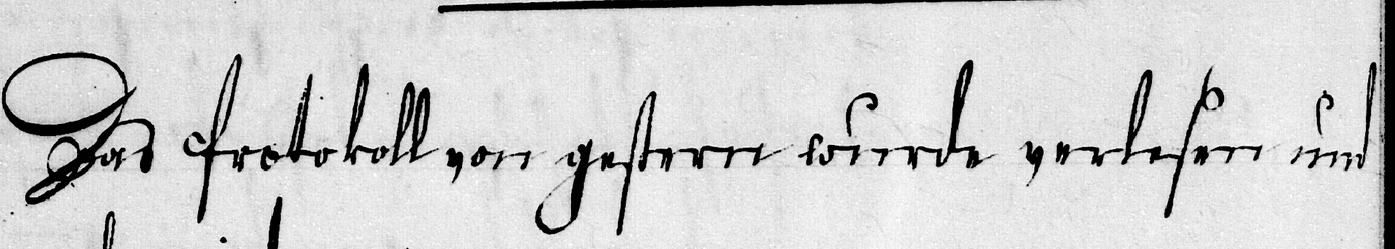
Das Protokoll von gestern wurde verlesen und
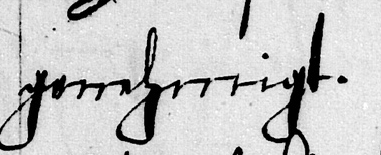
genehmigt.
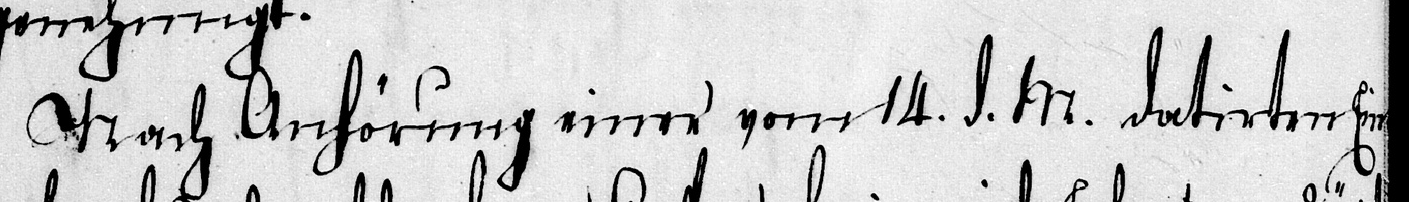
Nach Anhörung einer vom 14. d. M. datirten Ein¬
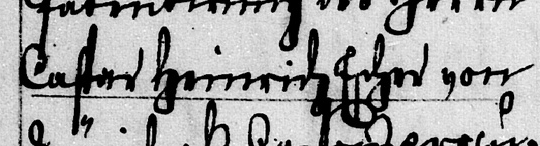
Caspar Heinrich Escher von
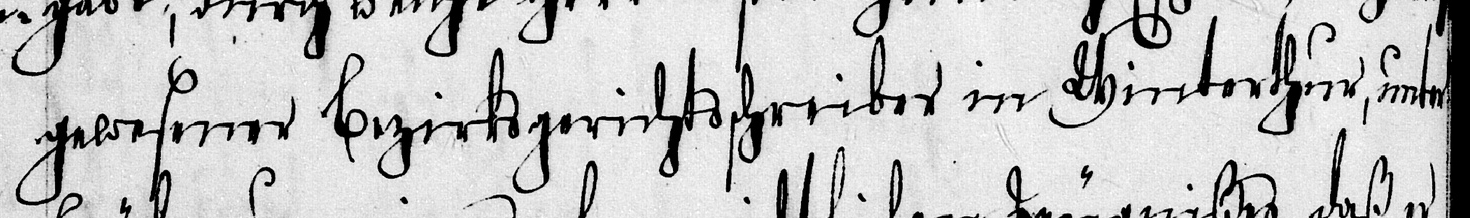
gewesener Bezirksgerichtsschreiber in Winterthur, un¬
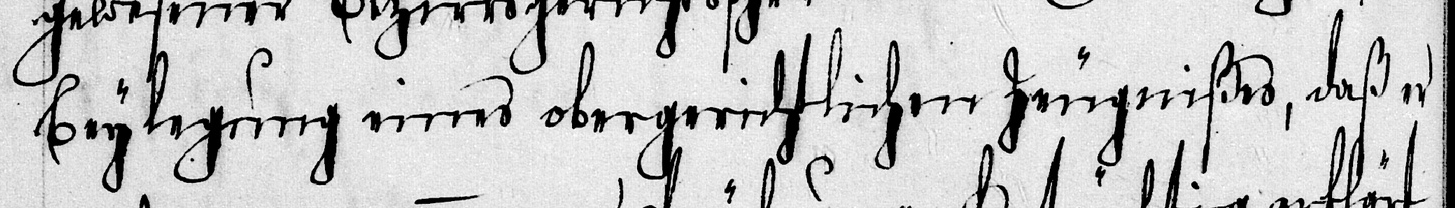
Beylegung eines obergerichtlichen Zeugnißes, daß er
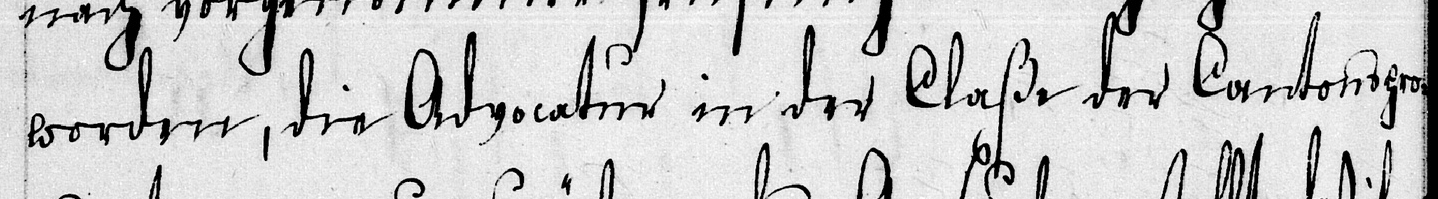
worden, die Advocatur in der Claße der Cantonspr¬
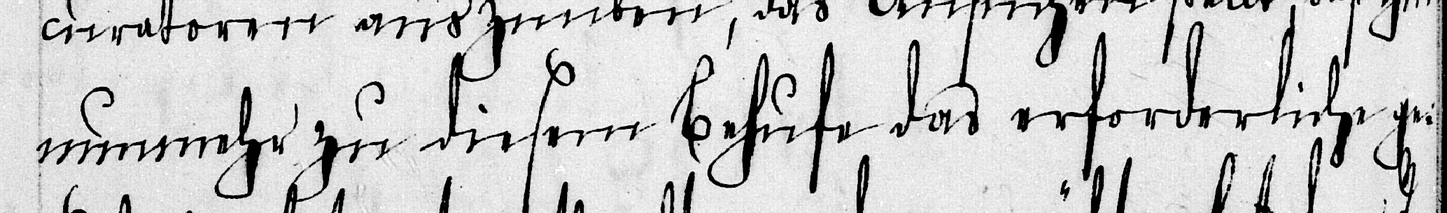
nunmehr zu diesem Behufe das erforderliche
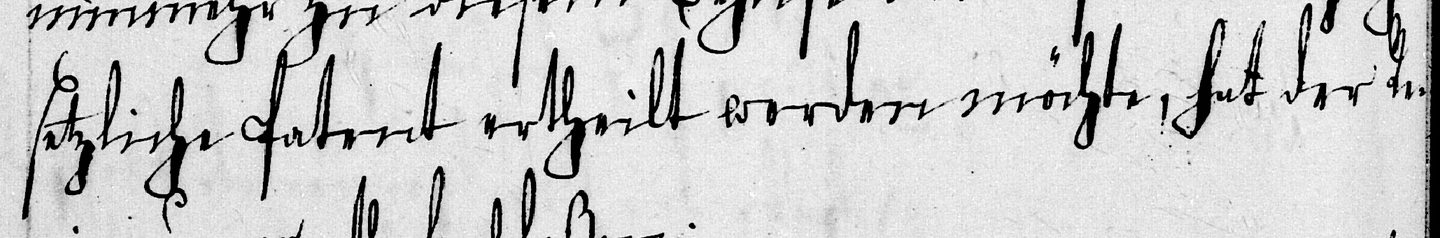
setzliche Patent ertheilt werden möchte, hat der R¬
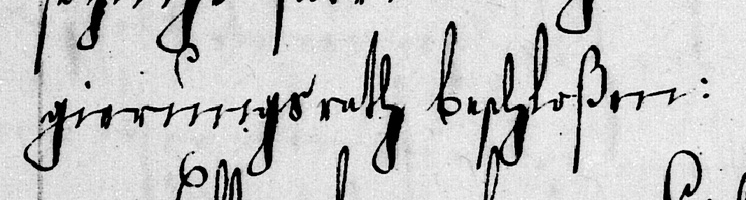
egierungsrath beschloßen:
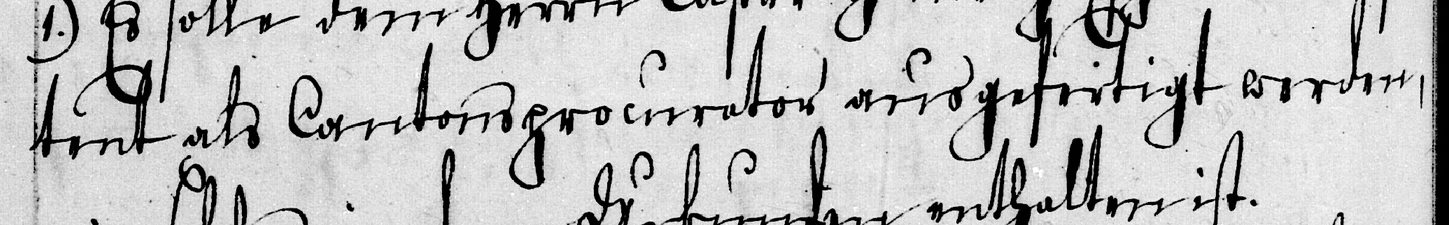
tent als Cantonsprocurator ausgefertigt werden,
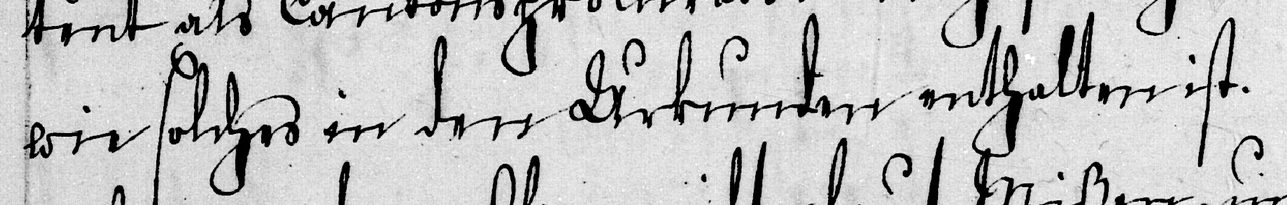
wie solches in den Urkunden enthalten ist.
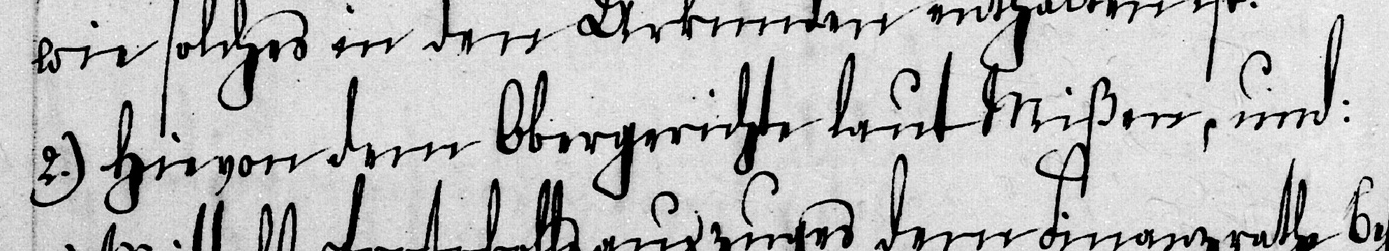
2.) Hievon dem Obergerichte laut Miß[iv]en, und:
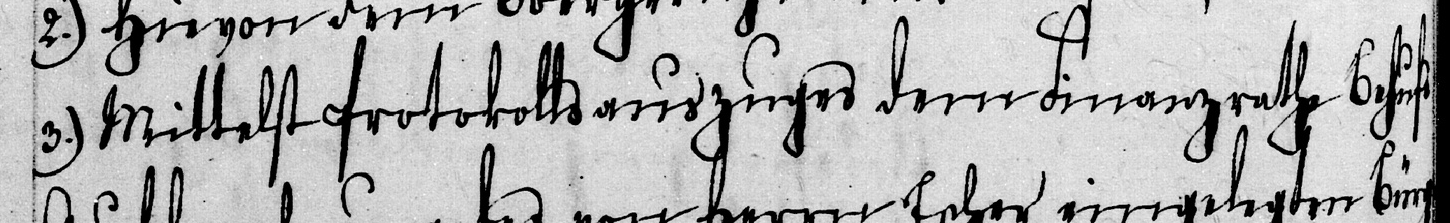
3.) Mittelst Protokollsauszuges dem Finanzrathe Behu¬
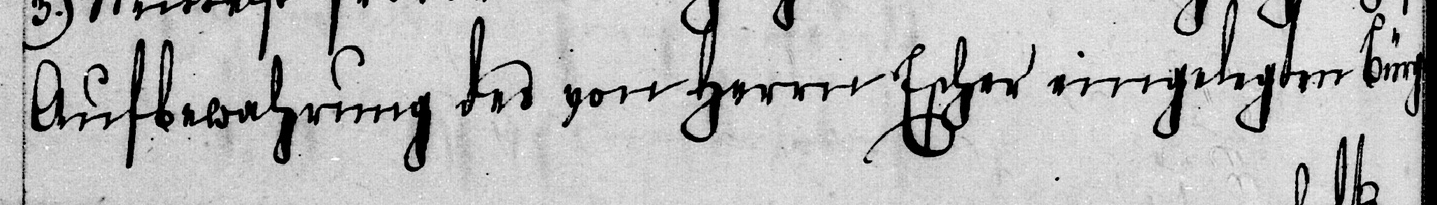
Aufbewahrung des von Herrn Escher eingelegten Bü¬
